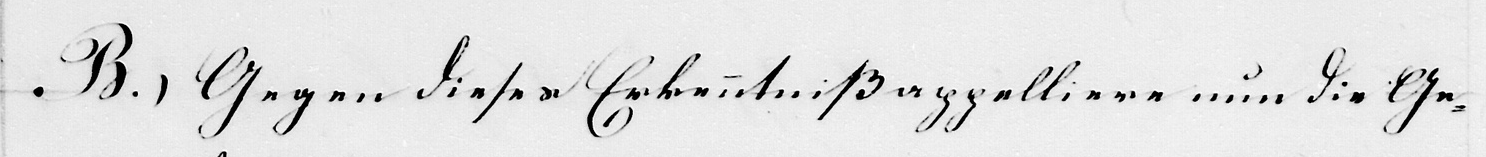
B.) Gegen dieses Erkenntniß appelliere nun die Ge¬
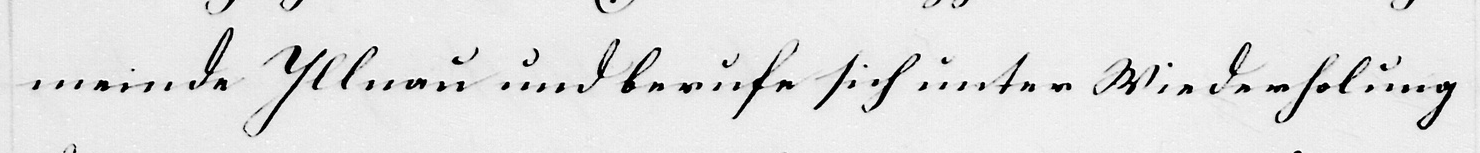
meinde Illnau und berufe sich unter Wiederholung
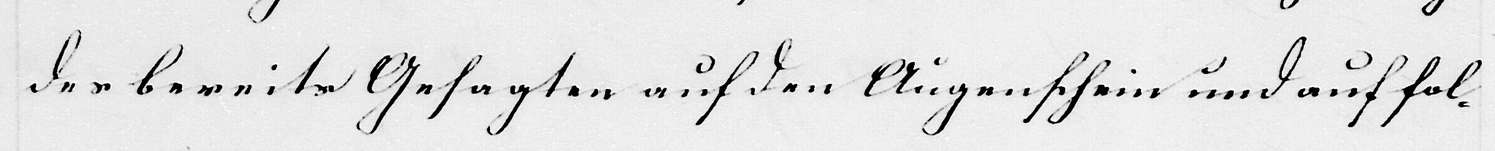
des bereits Gesagten auf den Augenschein und auf fol¬
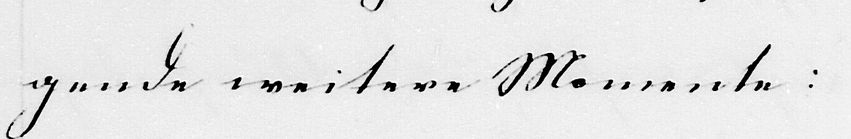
gende weitere Momente:
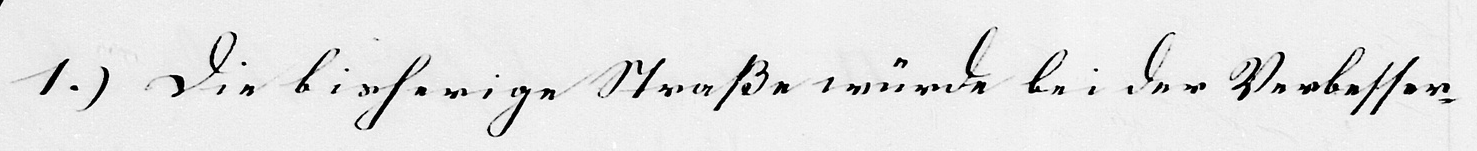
1.) Die bisherige Straße würde bei der Verbesser¬
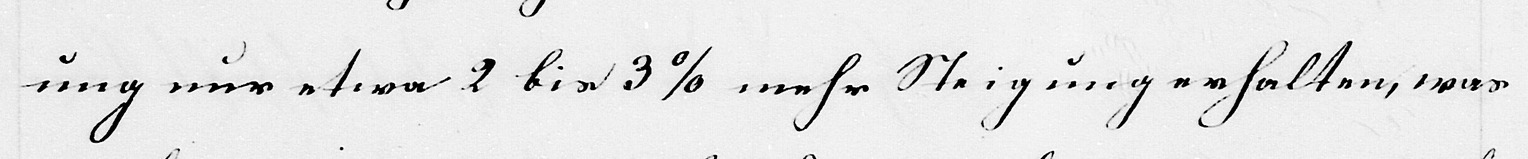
ung nur etwa 2 bis 3 % mehr Steigung erhalten, was
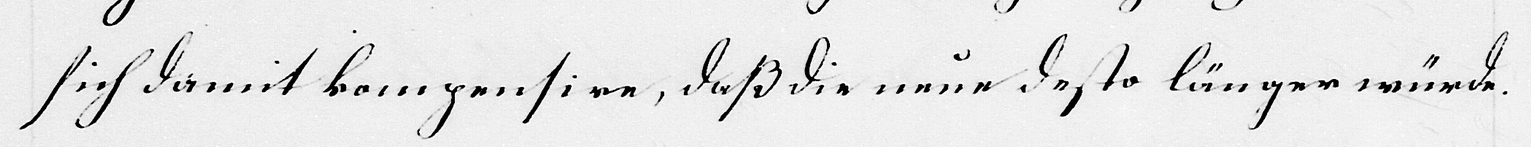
sich damit kompensire, daß die neue desto länger würde.
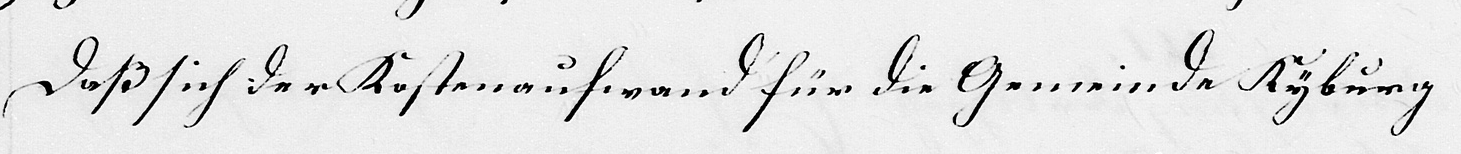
Daß sich der Kostenaufwand für die Gemeinde Kyburg
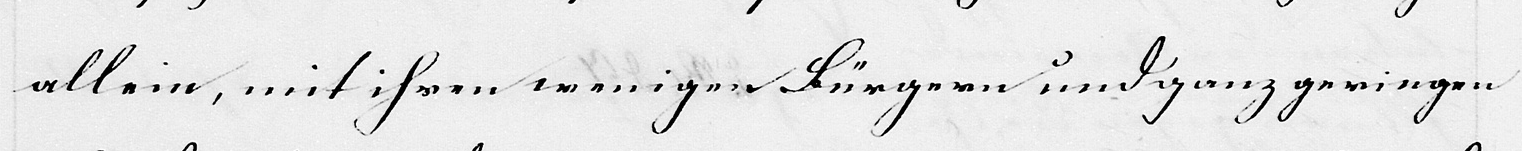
allein, mit ihren wenigen Bürgern und ganz geringen
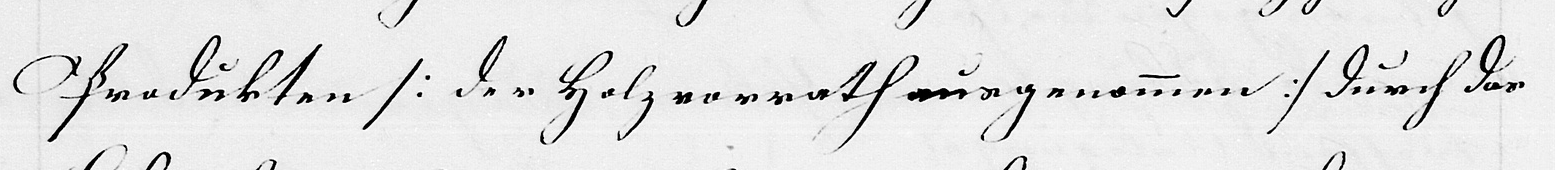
Produkten [der Holzvorrath ausgenommen] durch das
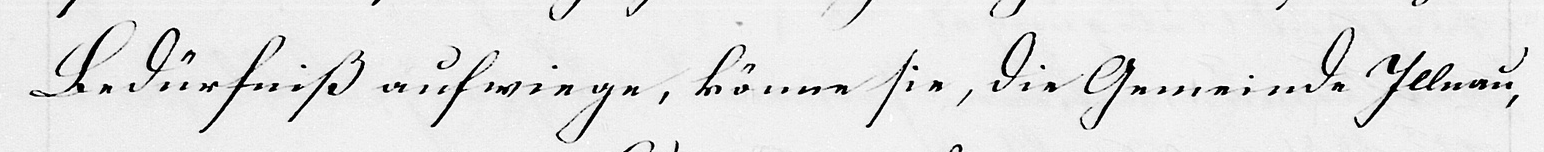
Bedürfniß aufwiege, könne sie, die Gemeinde Illnau,
